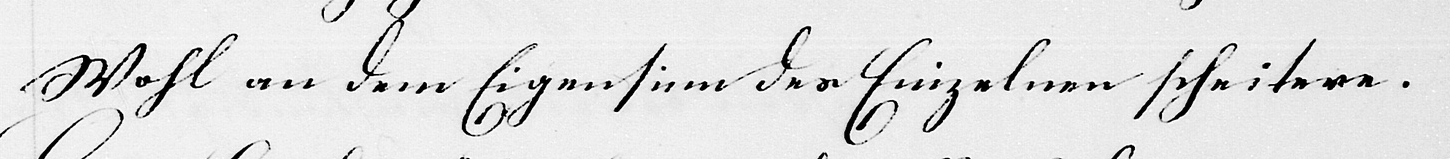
Wohl an dem Eigensinne des Einzelnen scheitere.
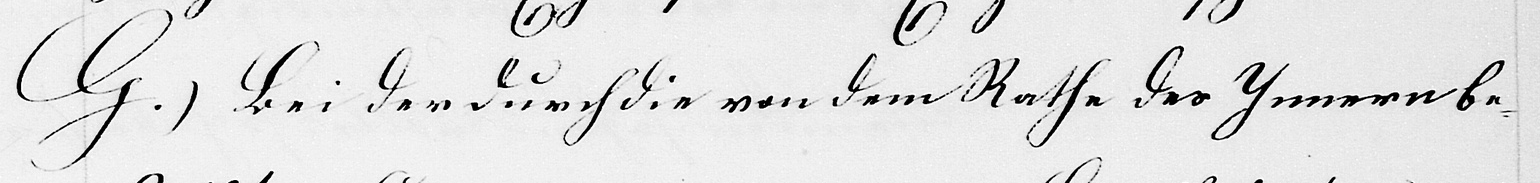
G.) Bei der durch die von dem Rathe des Innern be¬
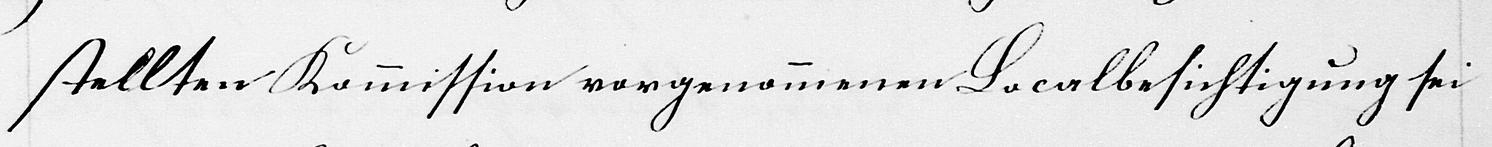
stellten Kommission vorgenommenen Localbesichtigung sei
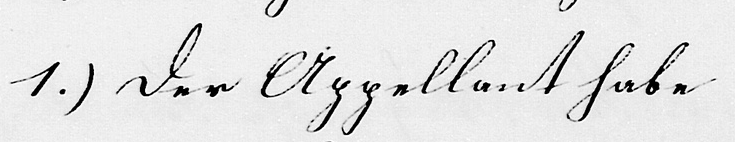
1.) Der Appellant habe
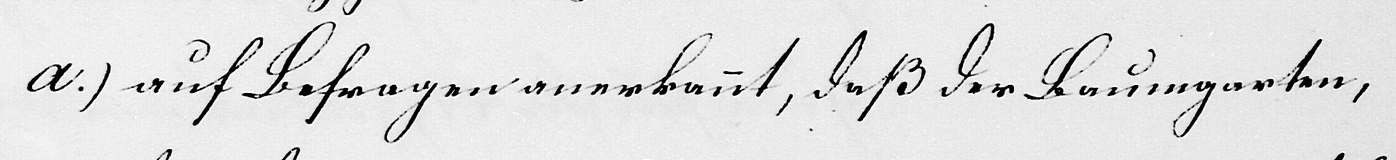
a.) auf Befragen anerkannt, daß der Baumgarten,
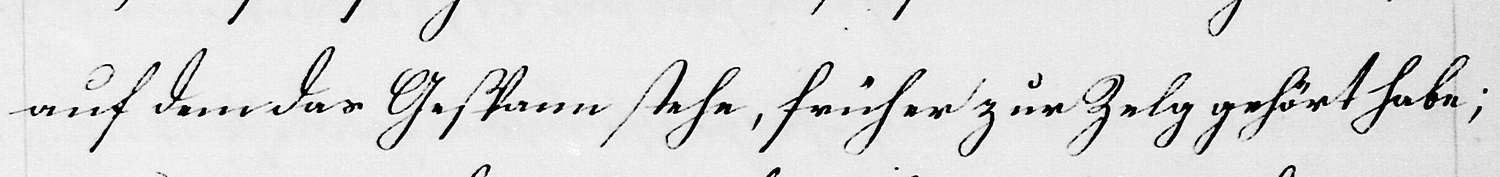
auf dem das Gespann stehe, früher zur Zelg gehört habe;
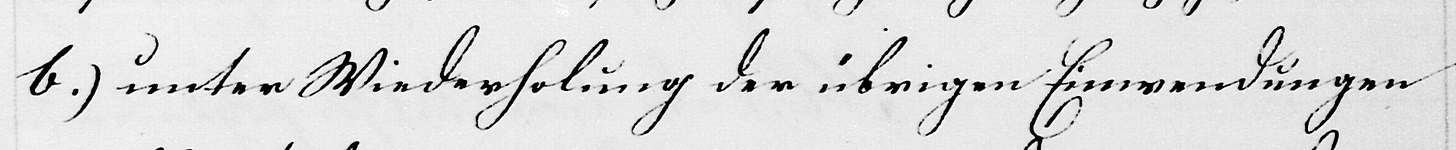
b.) unter Wiederholung der übrigen Einwendungen
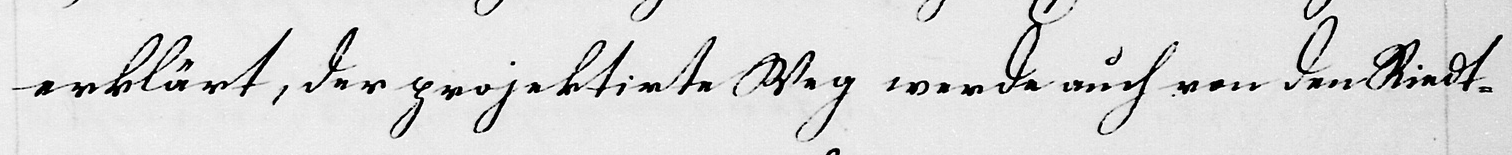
erklärt, der projektirte Weg werde auch von den Riedt¬
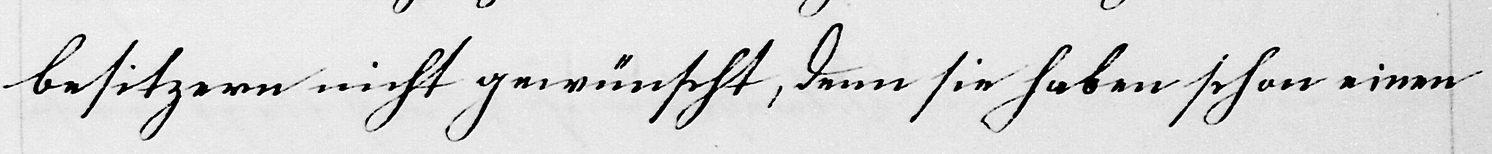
besitzern nicht gewünscht, denn sie haben schon einen
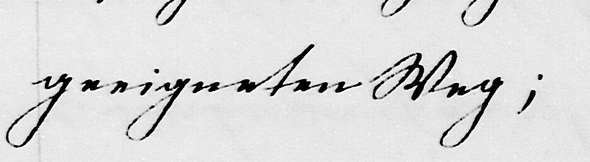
geeigneten Weg;
